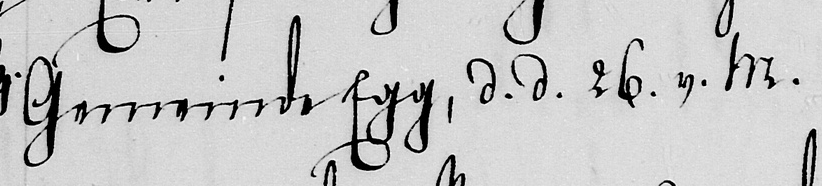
Gemeinde Egg, d. d. 26. v. M.
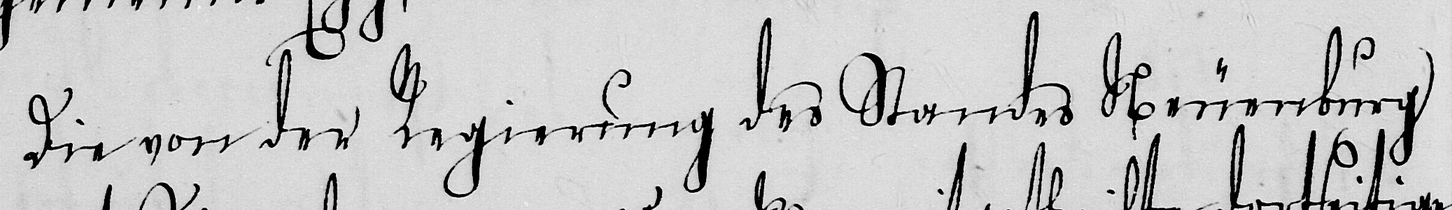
Die von der Regierung des Standes Neuenburg
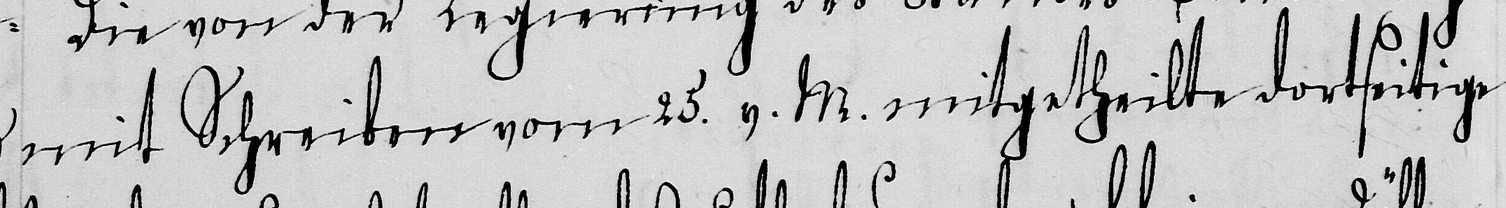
mit Schreiben vom 25. v. M. mitgetheilte dortseitige
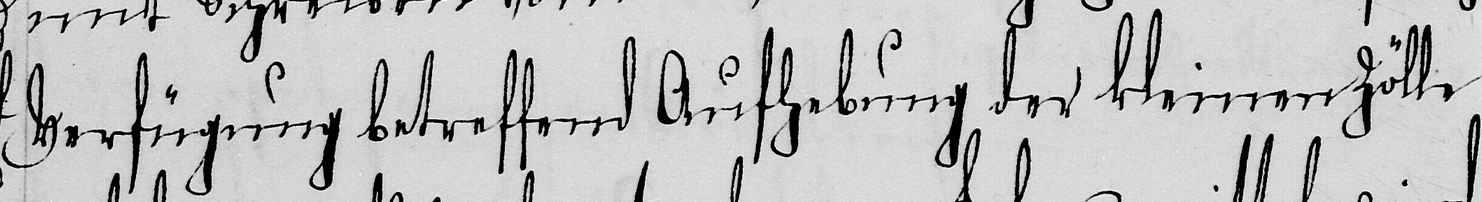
Verfügung betreffend Aufhebung der kleinen Zölle
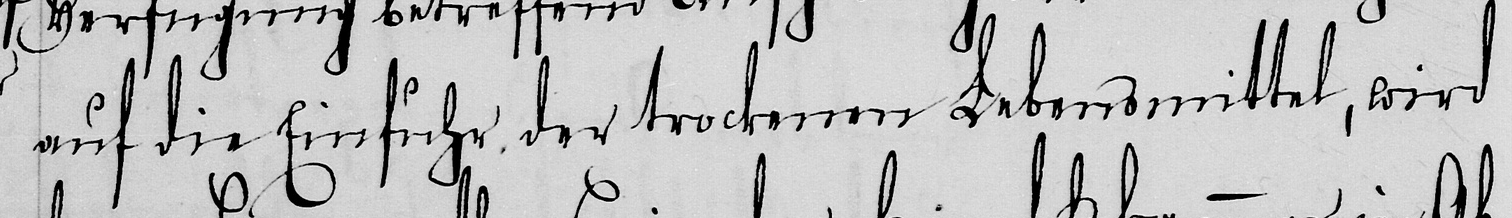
auf die Einfuhr der trockenen Lebensmittel, wird
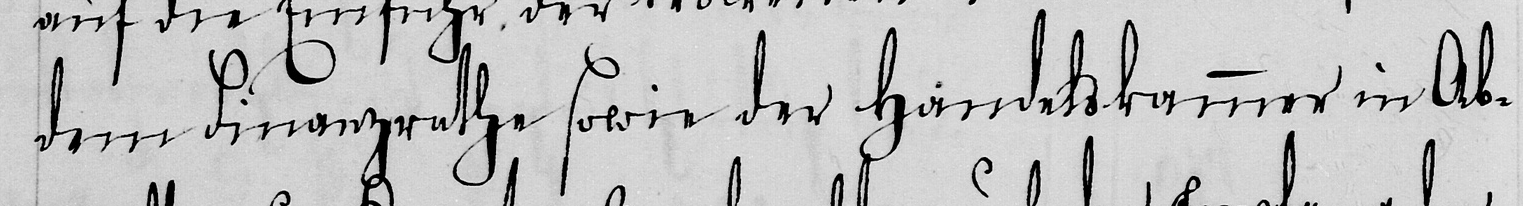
dem Finanzrathe sowie der Handelskammer in Ab¬
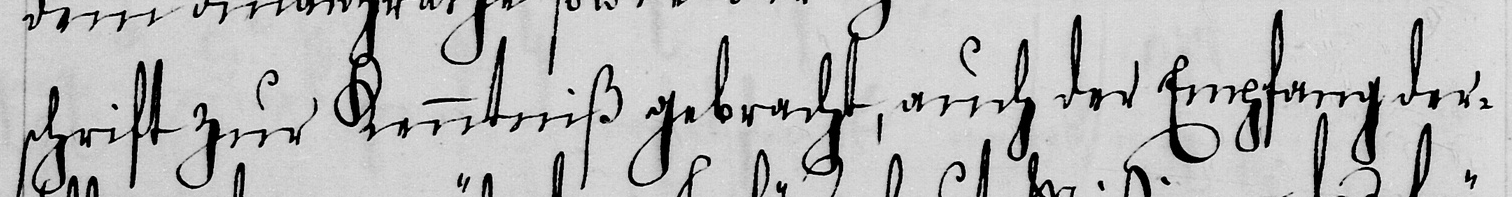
schrift zur Kenntniß gebracht, auch der Empfang der¬
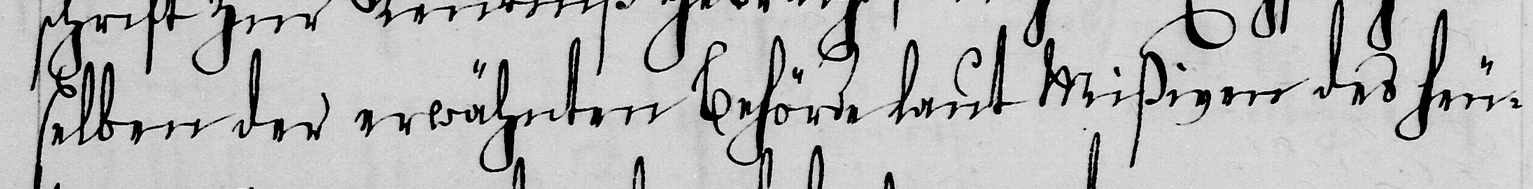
selben der erwähnten Behörde laut Mißiven des heu¬
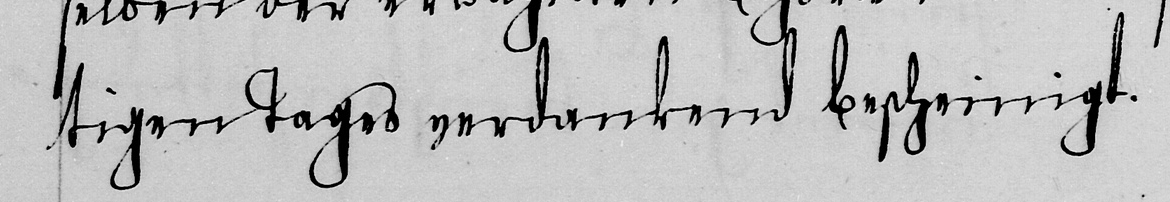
tigen Tages verdankend bescheinigt.
